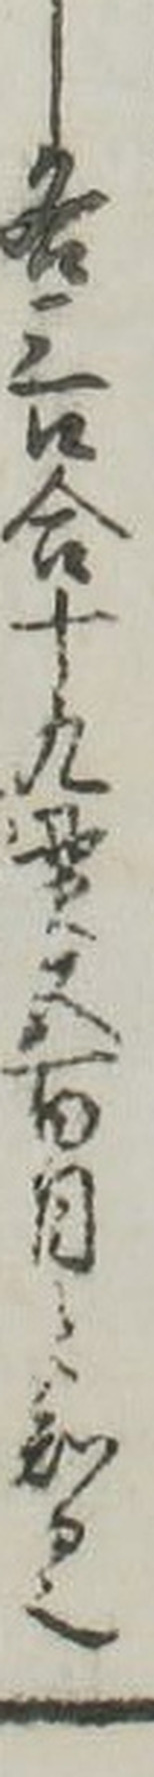各三口合十九貫五百目と知る也

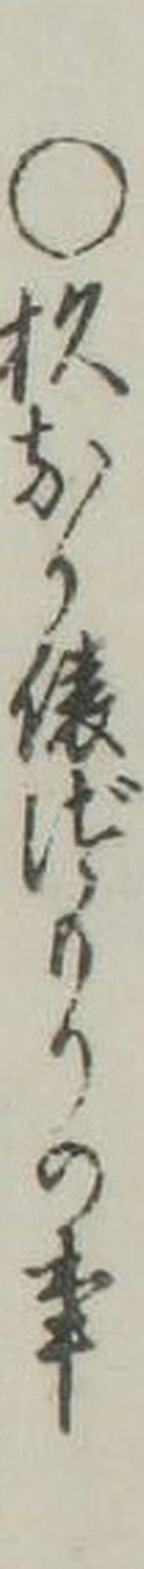○杉なり俵づもりの事
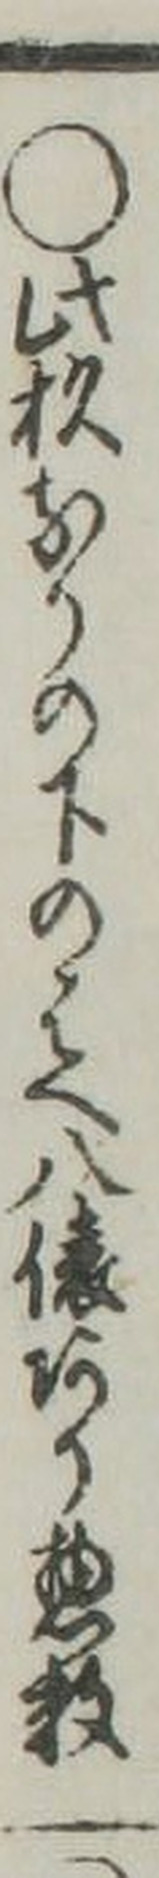○此杉なりの下のはへ八俵あり惣数
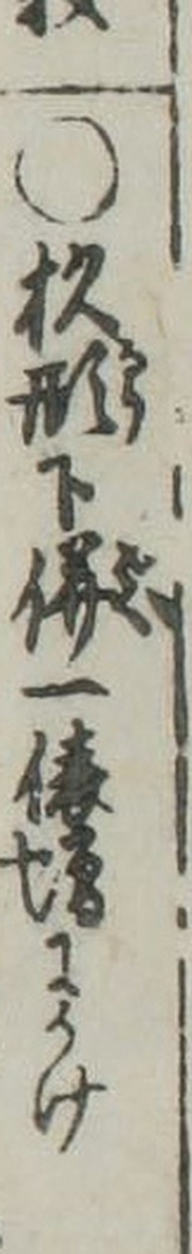○杉形下併一俵増にかけ
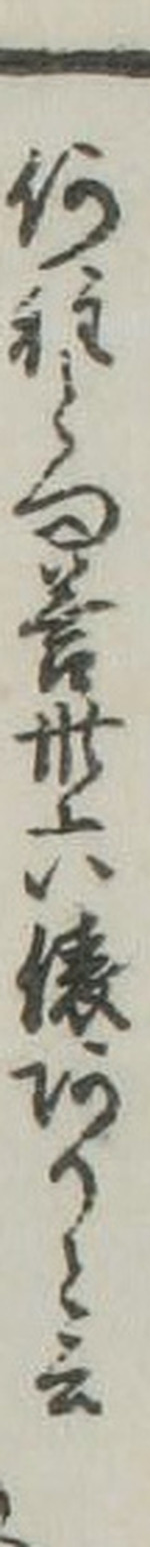何程と問答卅六俵ありと云
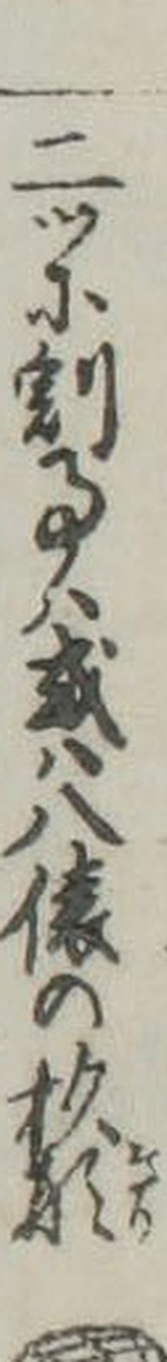二ツに割事は或は八俵の杉形
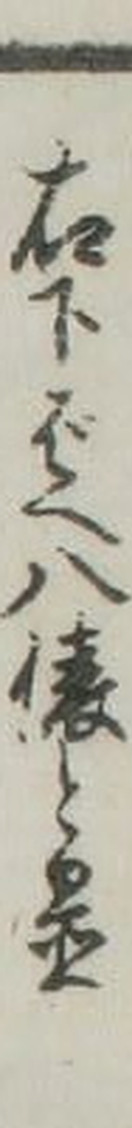右下ばへ八俵と置
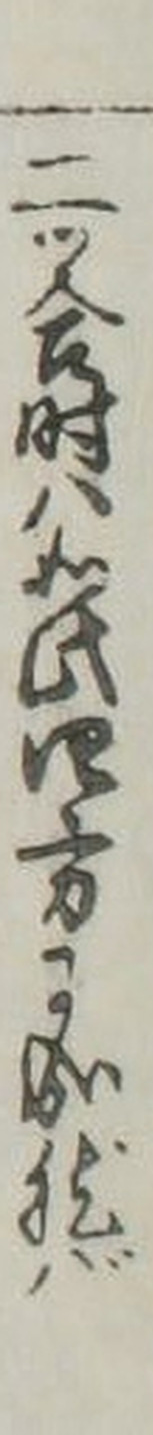二ツ合時は如此四方に成然ば
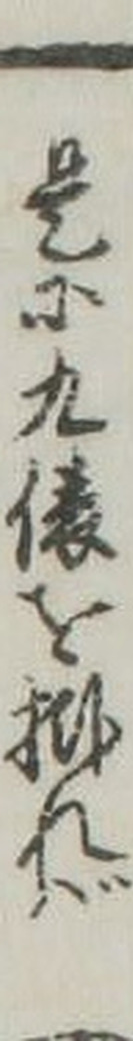是に九俵を掛れば
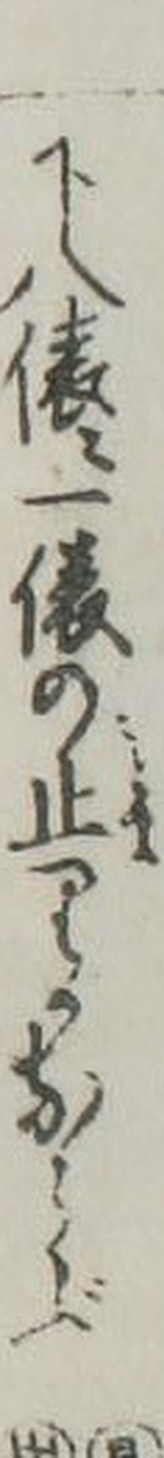下八俵に一俵の止りかならぶ
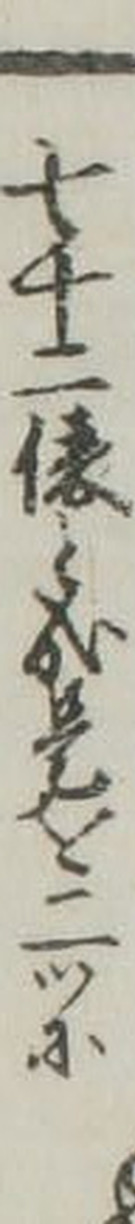七十二俵と是を二ツに
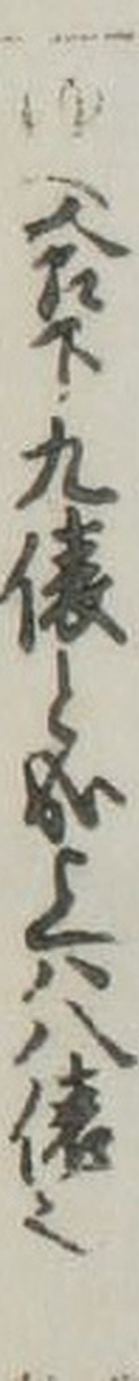ゆへ合下九俵と成上は八俵也
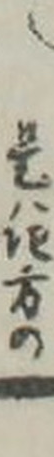是は四方の
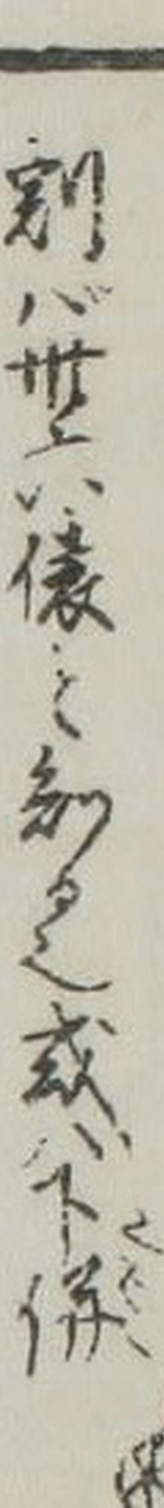割ば卅六俵と知る也或は下併
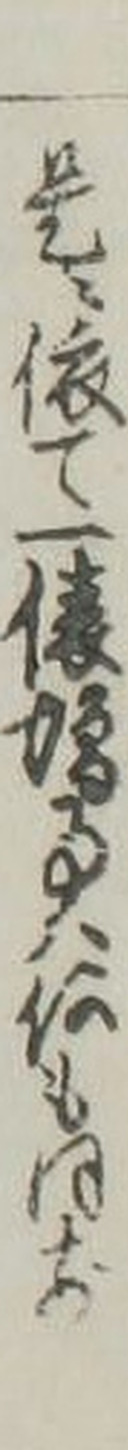是に依て俵一俵増事は何も同前
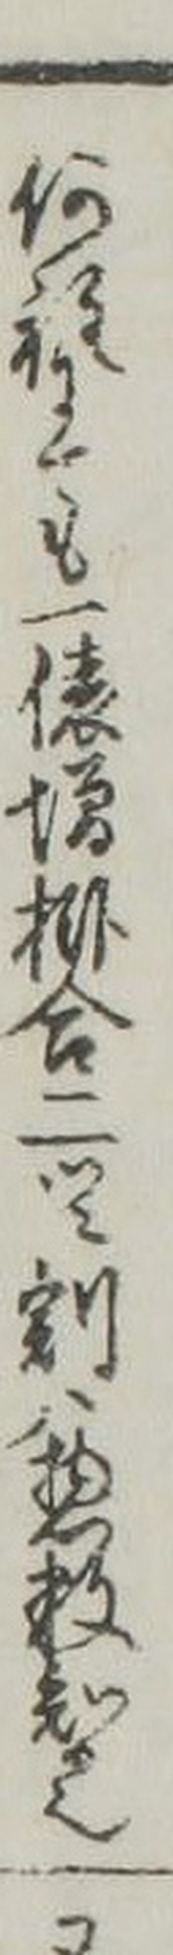何程にても一俵増掛合二ツに割は惣数知る也
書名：宝玉塵劫記
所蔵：東京学芸大学教育コンテンツアーカイブ
